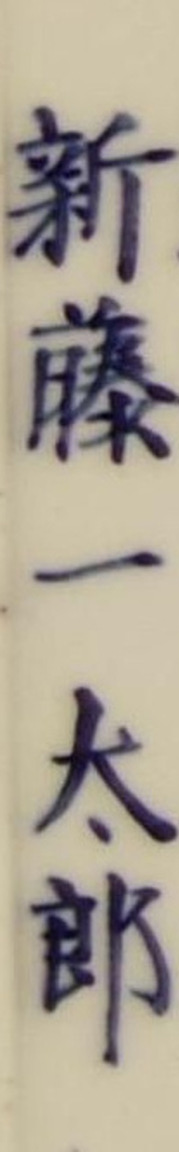新藤一太郎

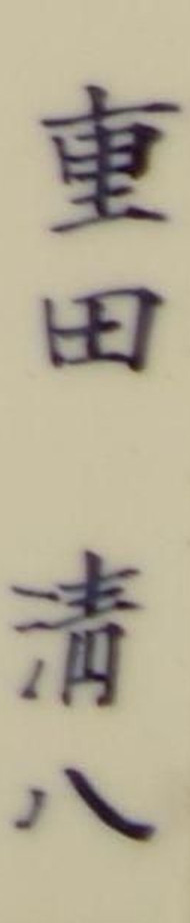重田清八
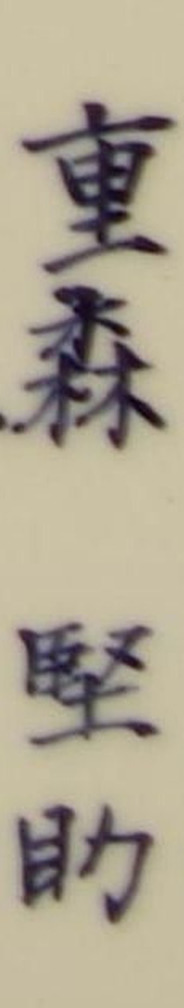重森堅助
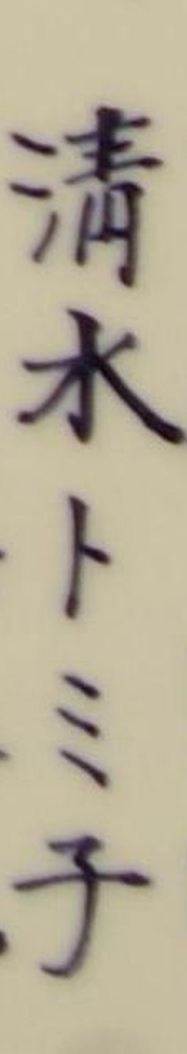清水トミ子
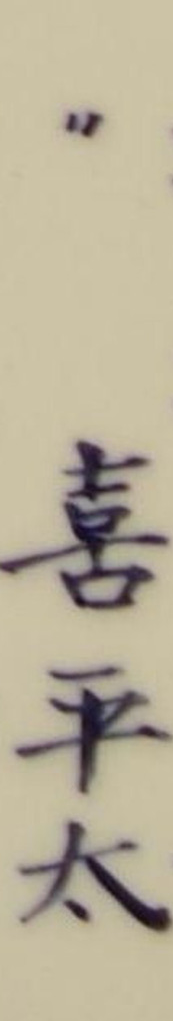喜平太
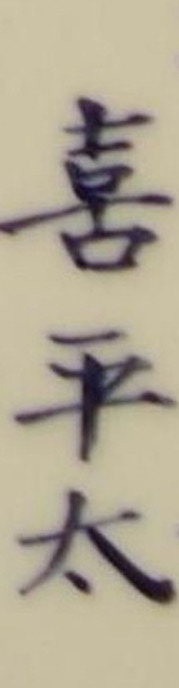喜平太
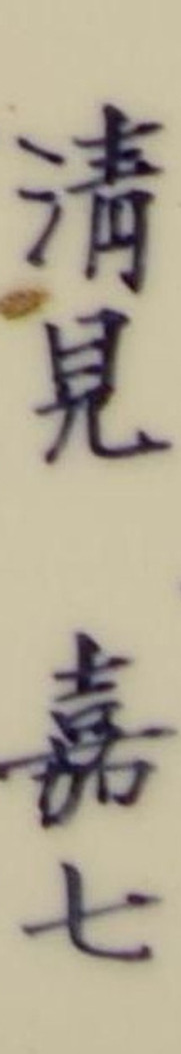清見嘉七
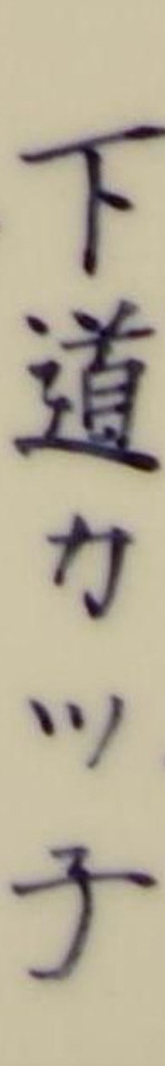下道カツ子
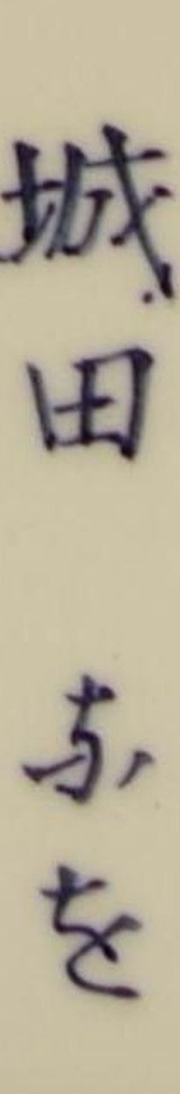城田なを
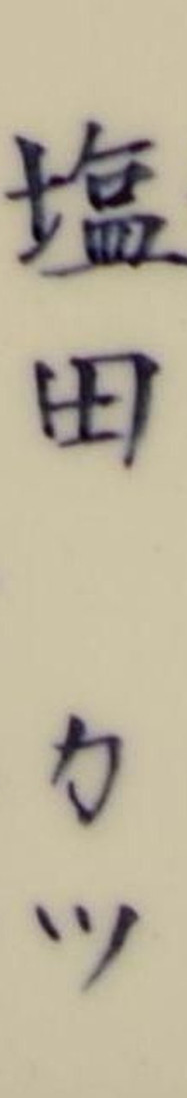塩田カツ
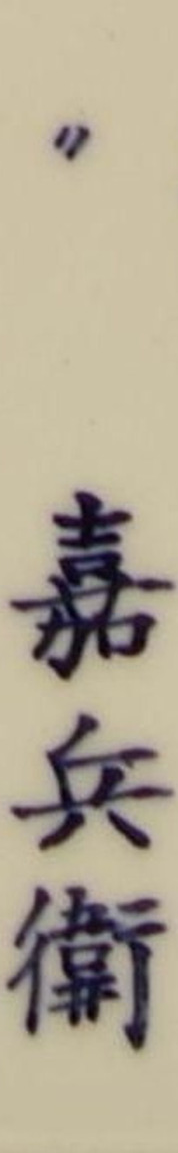嘉兵衛
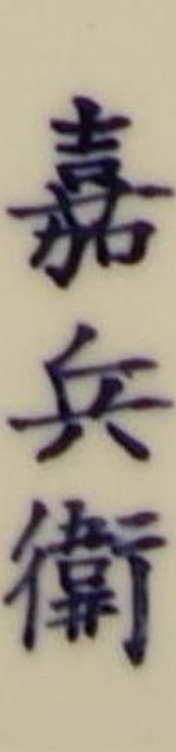嘉兵衛
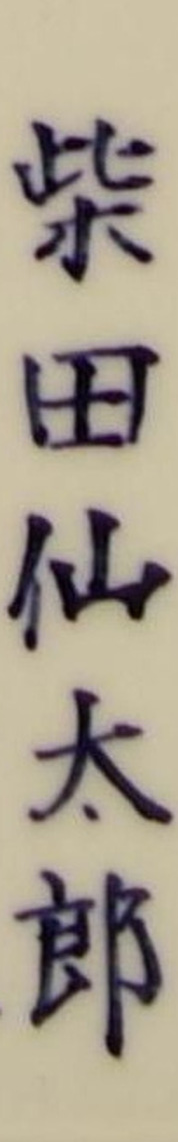柴田仙太郎
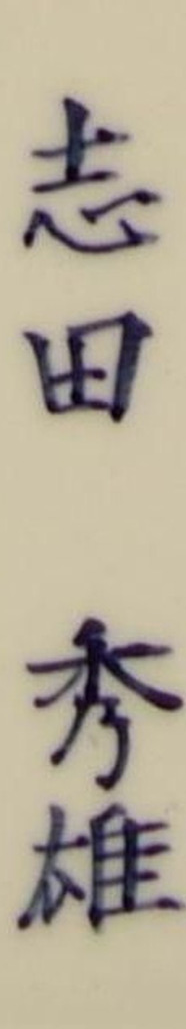志田秀雄
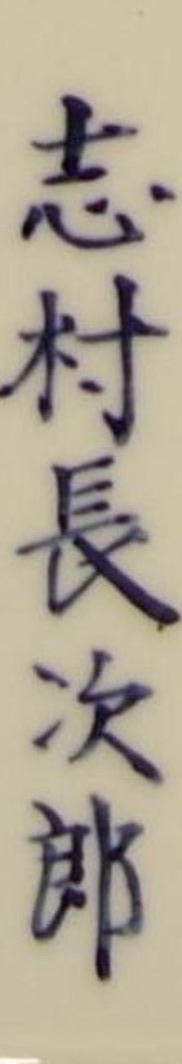志村長次郎
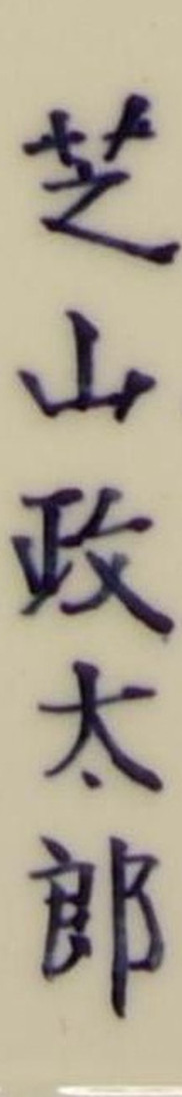芝山政太郎
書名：E~L
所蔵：高野山金剛峯寺
